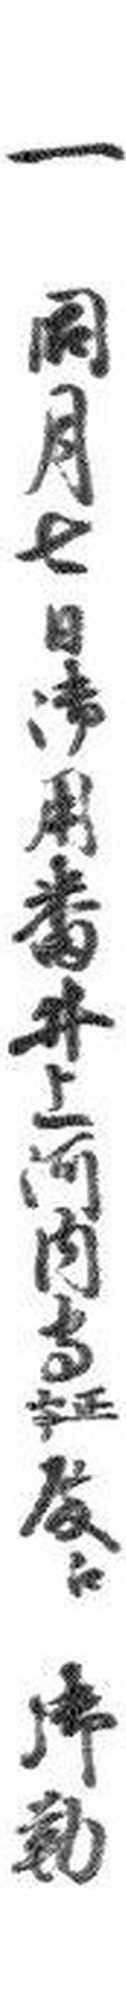一同月七日御用番井上河内守正峯殿江御勤
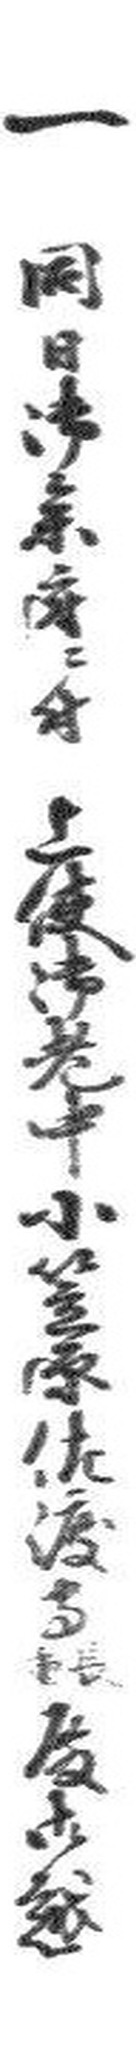一同日御参府ニ付上使御老中小笠原佐渡守長重殿御越
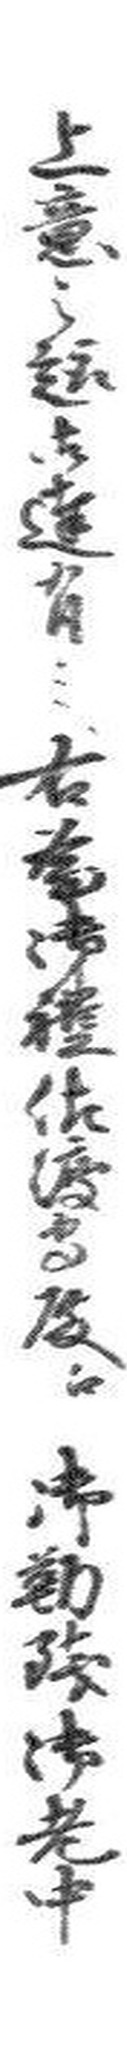上意之趣御達有之右為御礼佐渡守殿江御勤残御老中
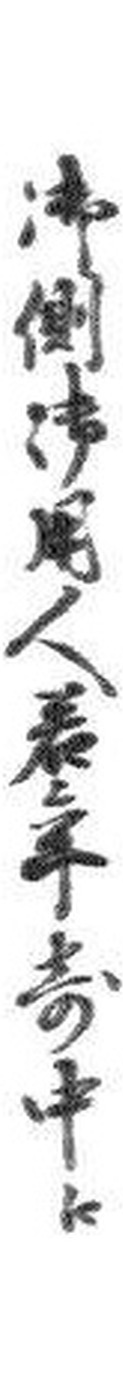御側御用人若年寄中江
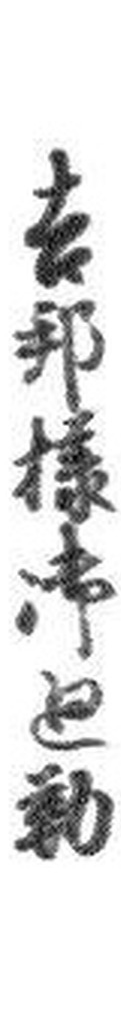吉邦様御廻勤

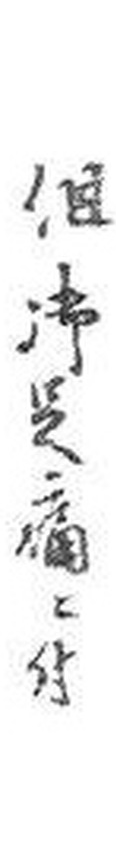但御足痛ニ付
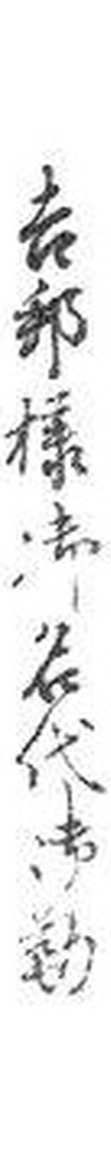吉邦様御名代御勤
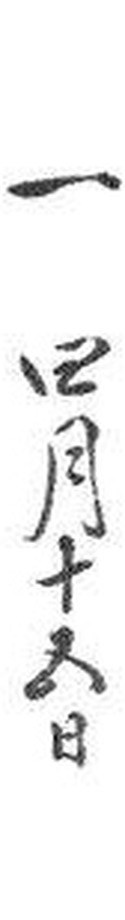一四月十五日
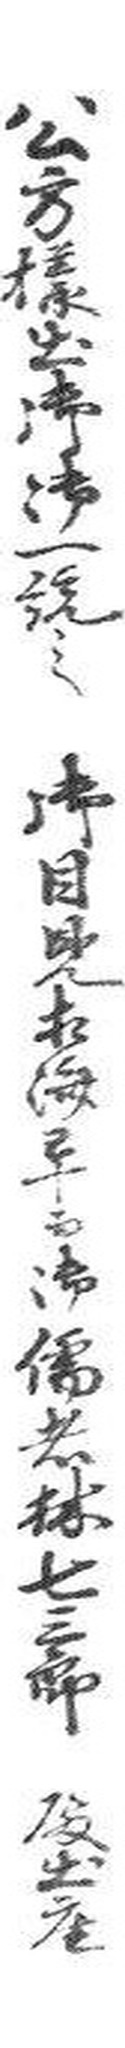公方様御出御御一統之御目見相済畢而御儒者林七三郎殿出座
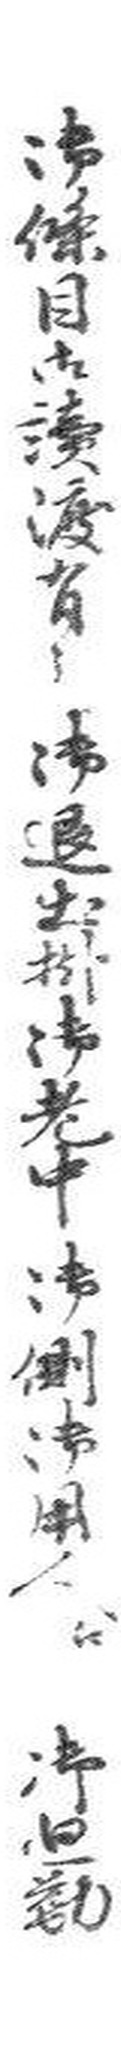御条目御読渡有之御退出掛御老中御側御用人江御廻勤
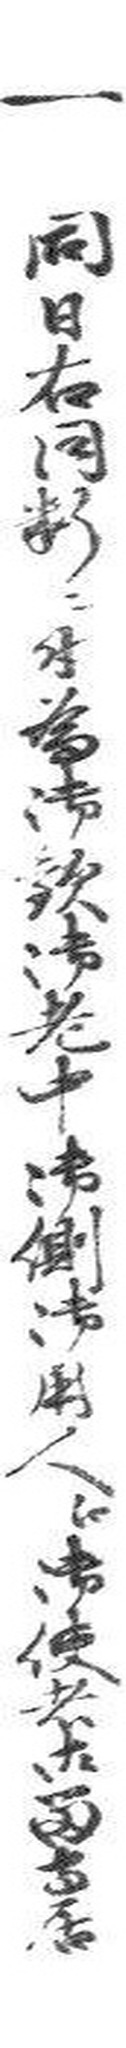一同日右同断ニ付為御歓御老中御側御用人江御使者留守居
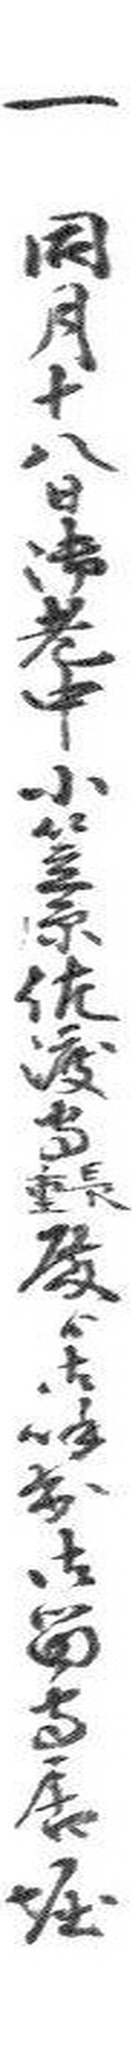一同月十八日御老中小笠原佐渡守長重殿ゟ御呼出御留守居堀
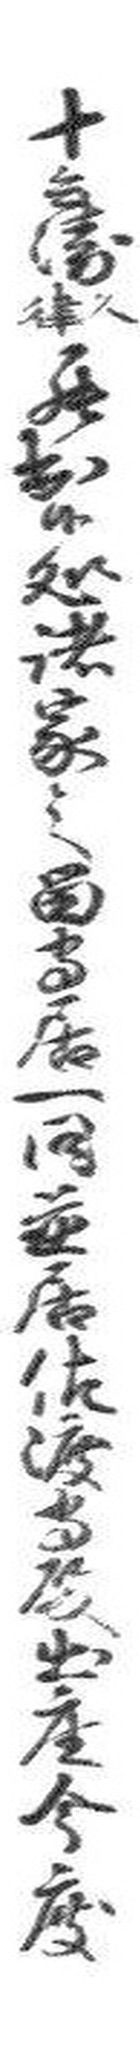十兵衛久律罷出候処諸家之留守居一同並居佐渡守殿出座今度
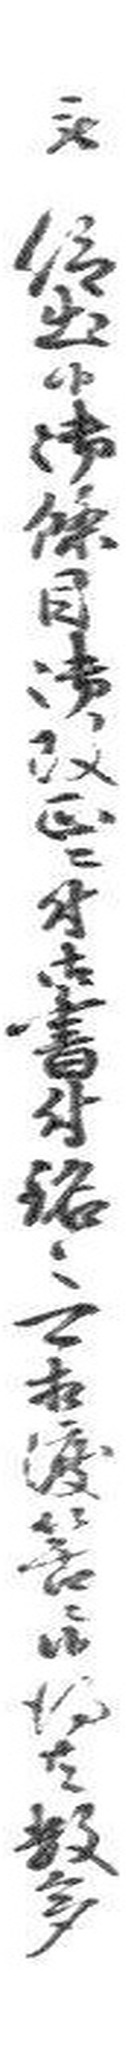被仰出候御条目御改正ニ付御書付銘々可相渡筈ニ候得共数多
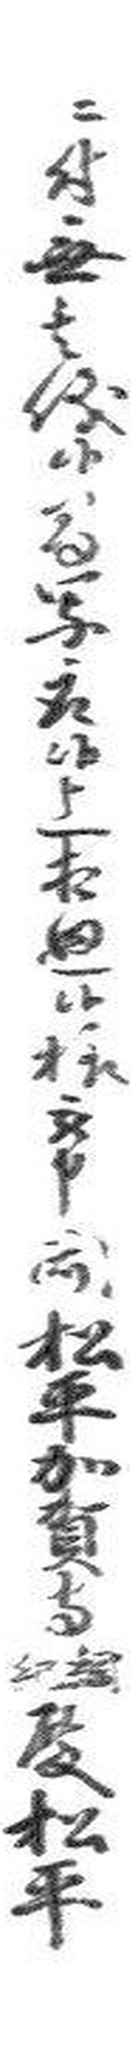ニ付無其義候間写取候上相廻候様被申聞松平加賀守綱紀殿松平
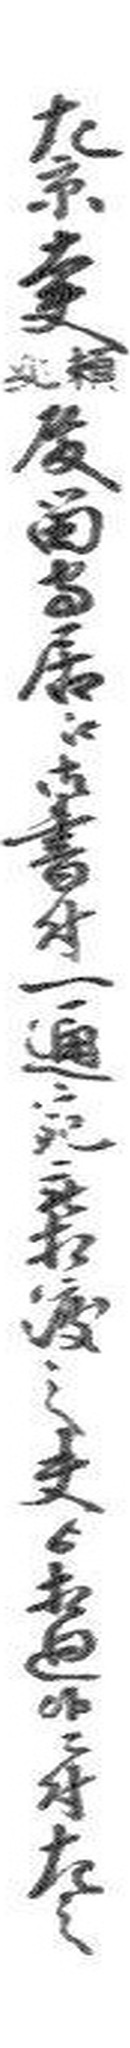左京太夫頼殿留守居江御書付一通宛被相渡之夫ゟ相廻候ニ付左之
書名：家譜 二十五 吉品公 従宝永六年到同七年
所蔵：福井県文書館 Fukui Prefectural Archives
